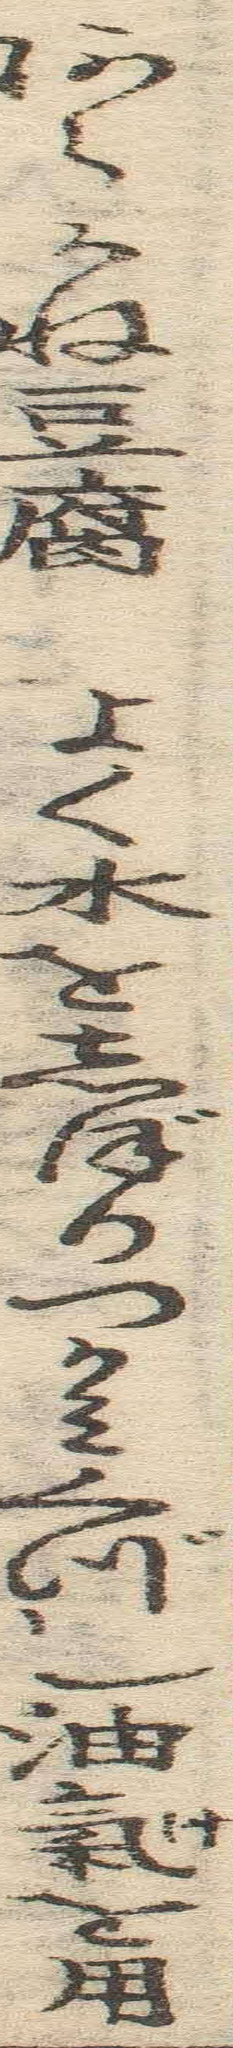[三]あらかね豆腐よく水をしぼりつかみくづし油気を用

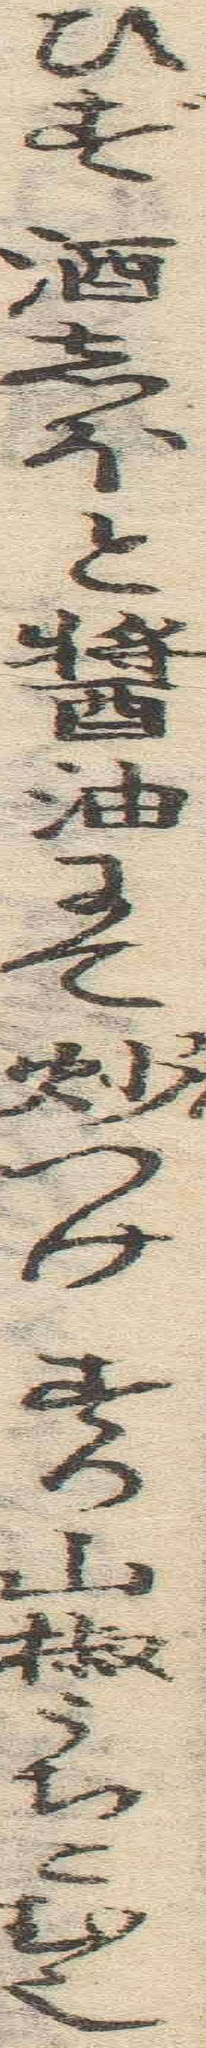ひず酒しほと醤油にて炒つけすり山椒うちこむ也
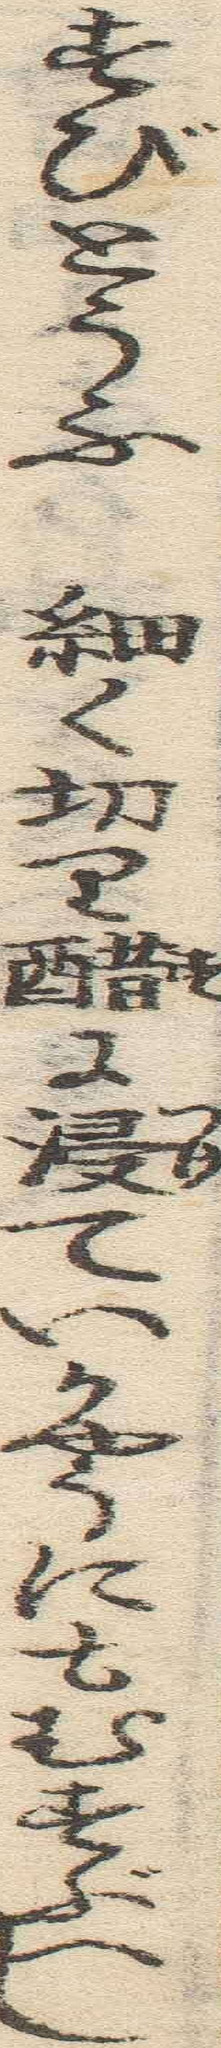[四]むすびとうふ細く切り醋に浸ていかやうにもむすぶへし
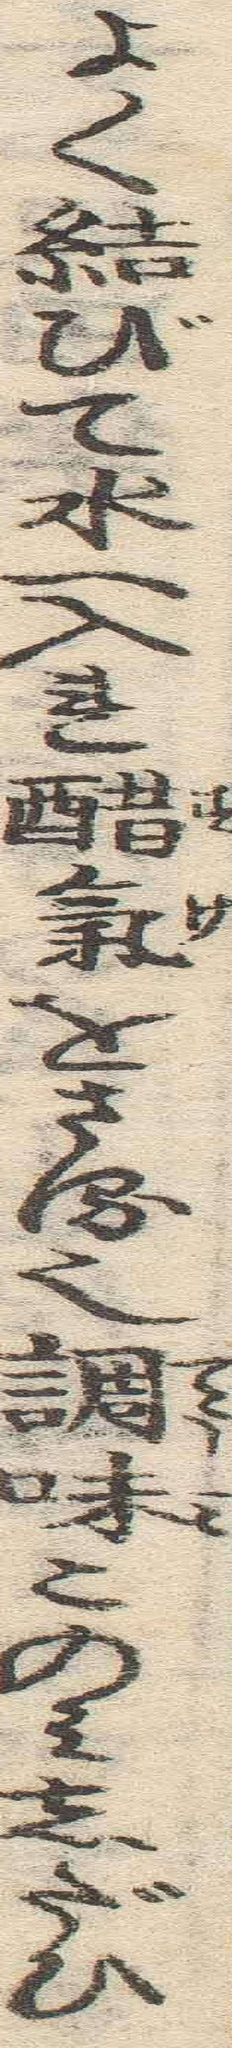よく結びて水へ入れ醋気をさる也調味このみしだひ
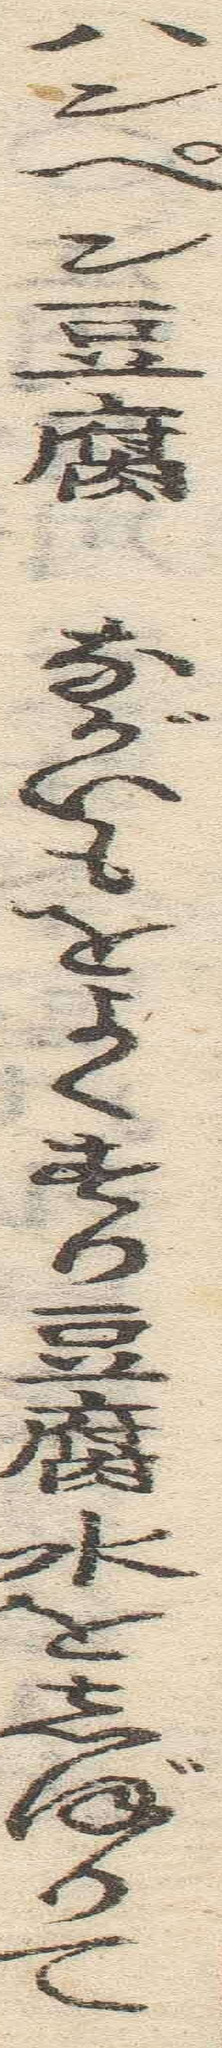[五]ハンペン豆腐ながいもをよくすり豆腐水をしぼりて
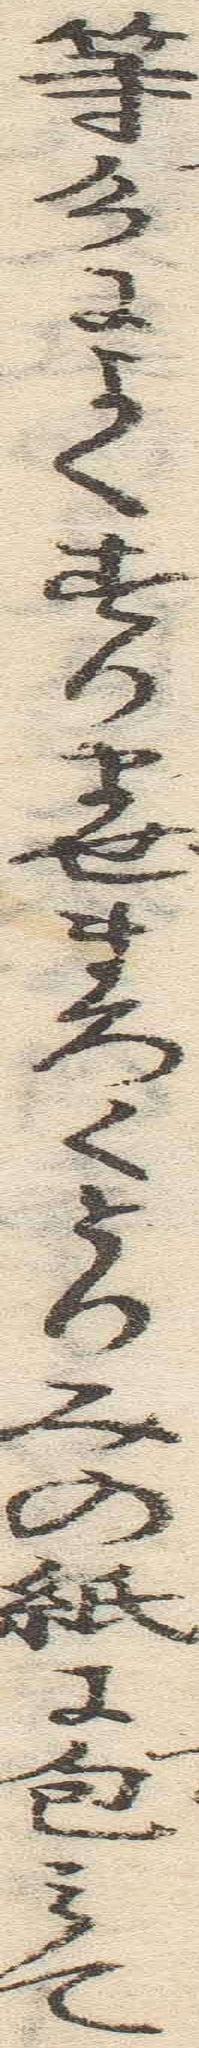等分によくすりまぜまろくとりみの紙に包みて
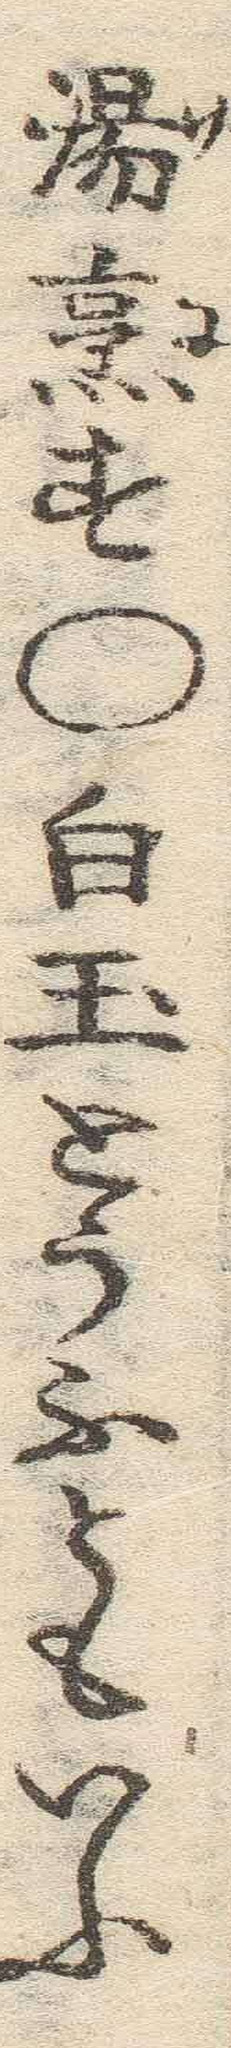湯烹す○白玉とうふともいふ
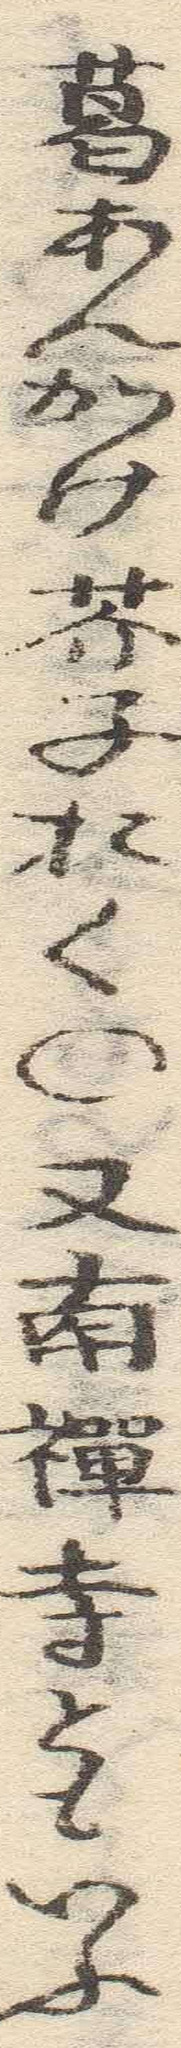葛あんかけ芥子おく○又南禅寺ともいふ
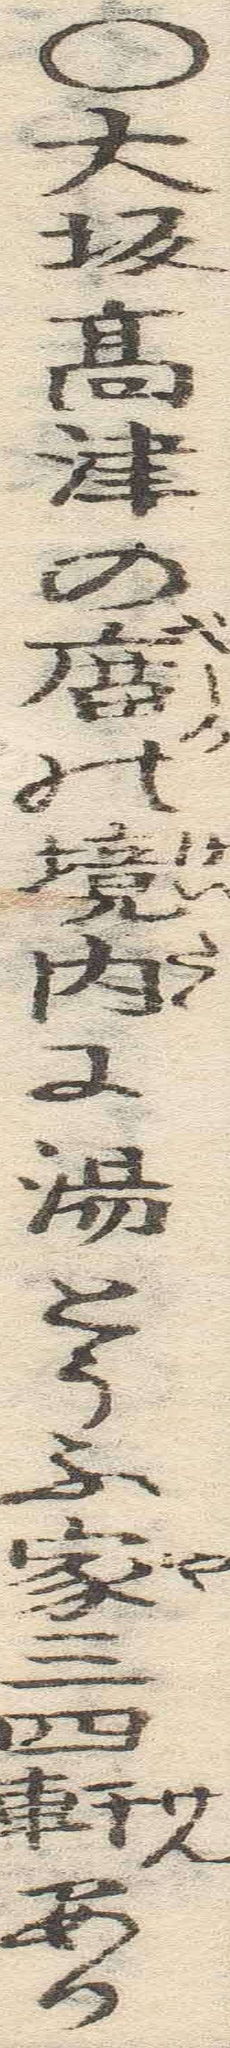○大坂高津の庿の境内に湯とうふ家三四軒あり
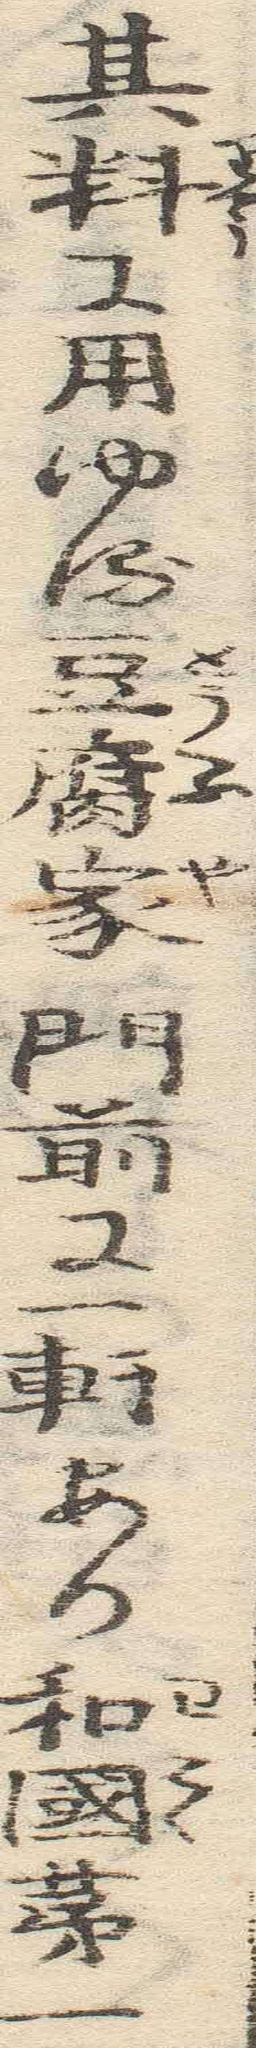其料に用ゆる豆腐家門前に一軒あり和国第一
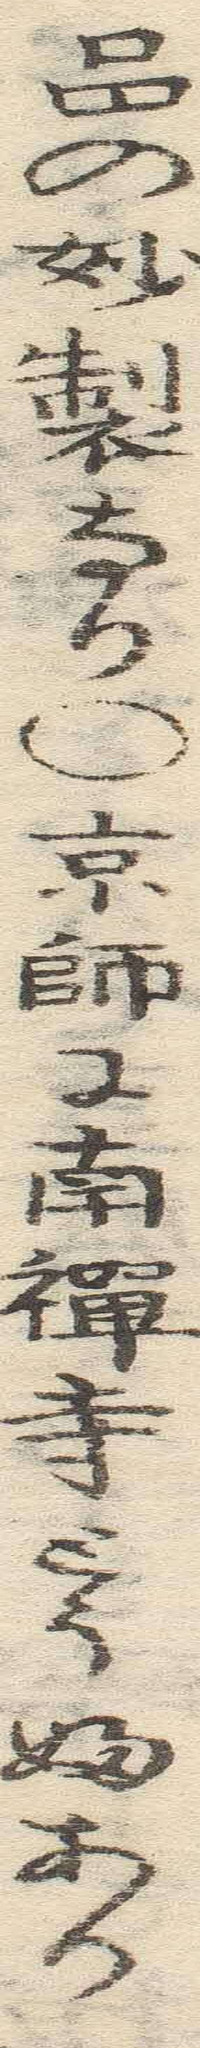品の妙製なり○京師に南禅寺とうふあり
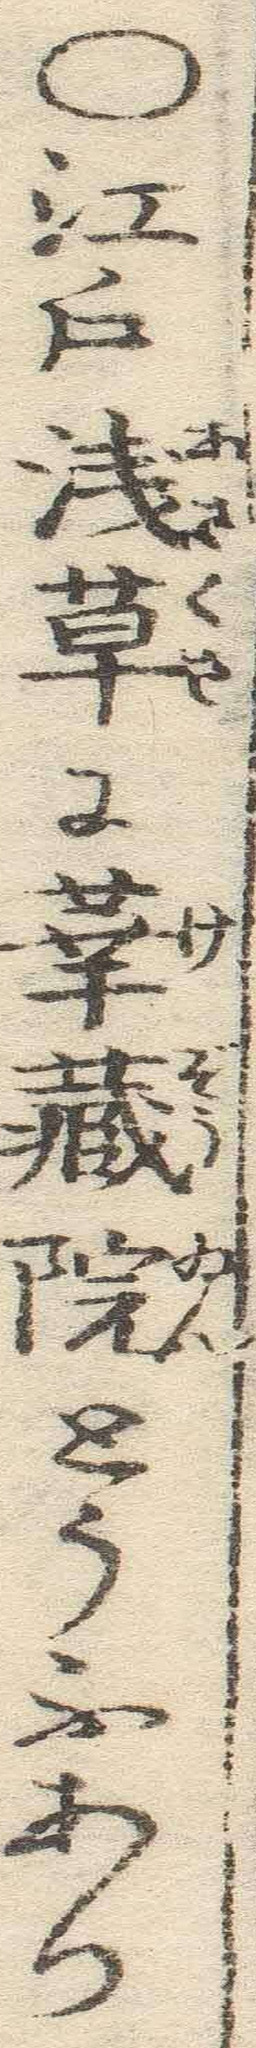○江戸浅草に華蔵院とうふあり
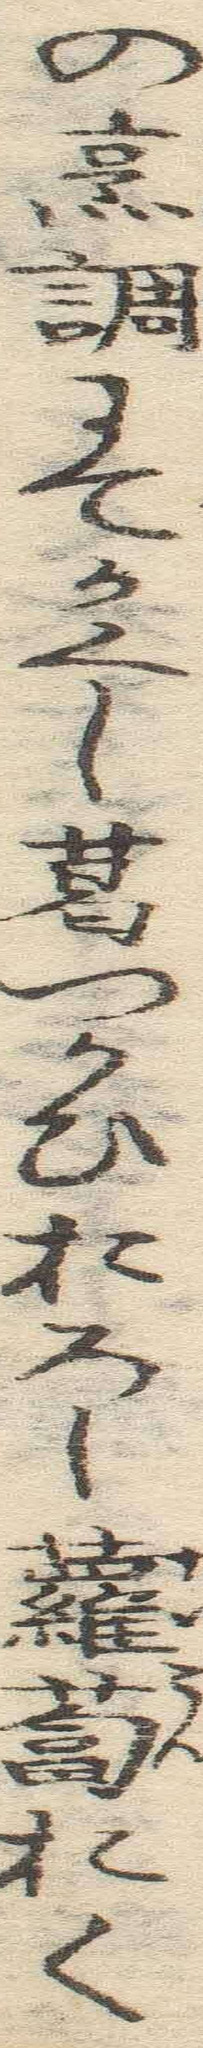の烹調にてかくし葛つかひおろし蘿蔔おく

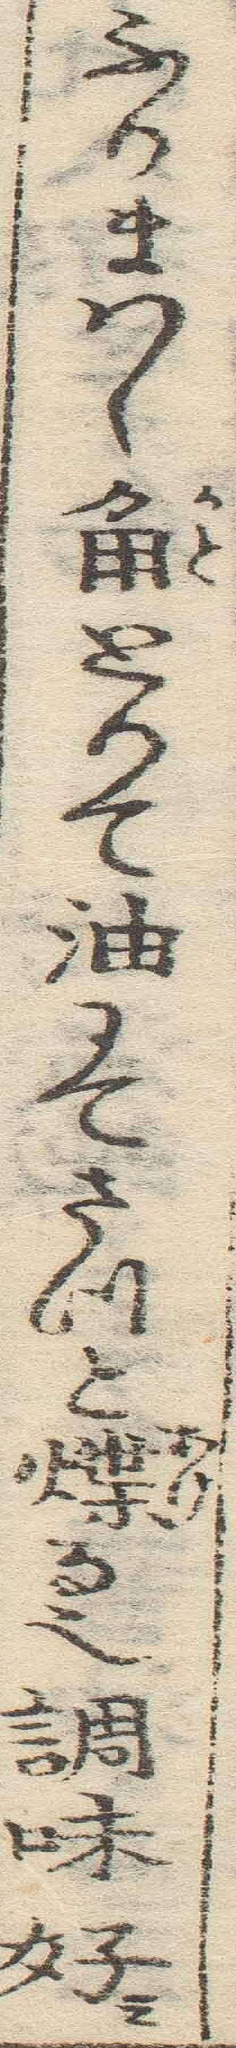ふりまはし角をとりて油にてさつと煠る也調味好み
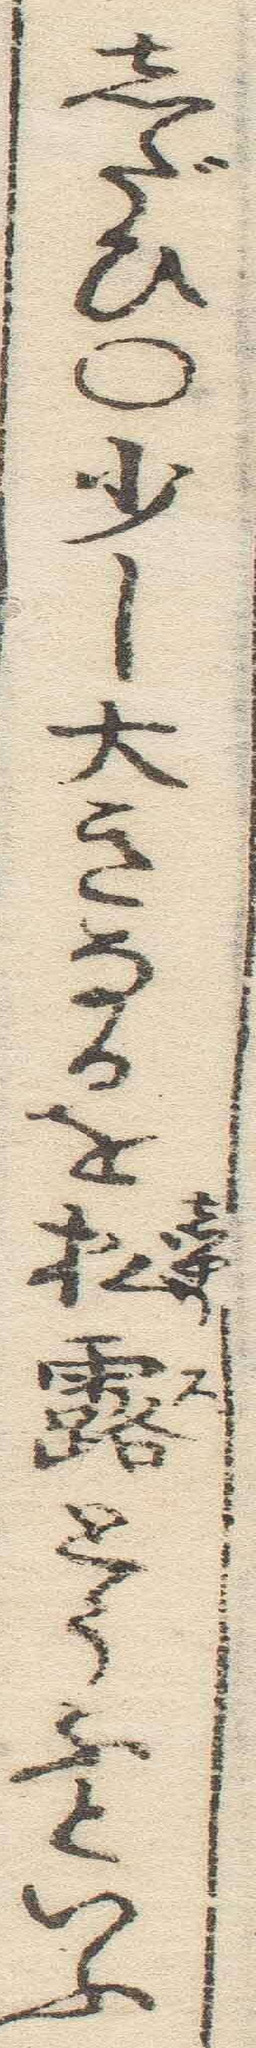しだひ○少し大きなるを松露とうふといふ
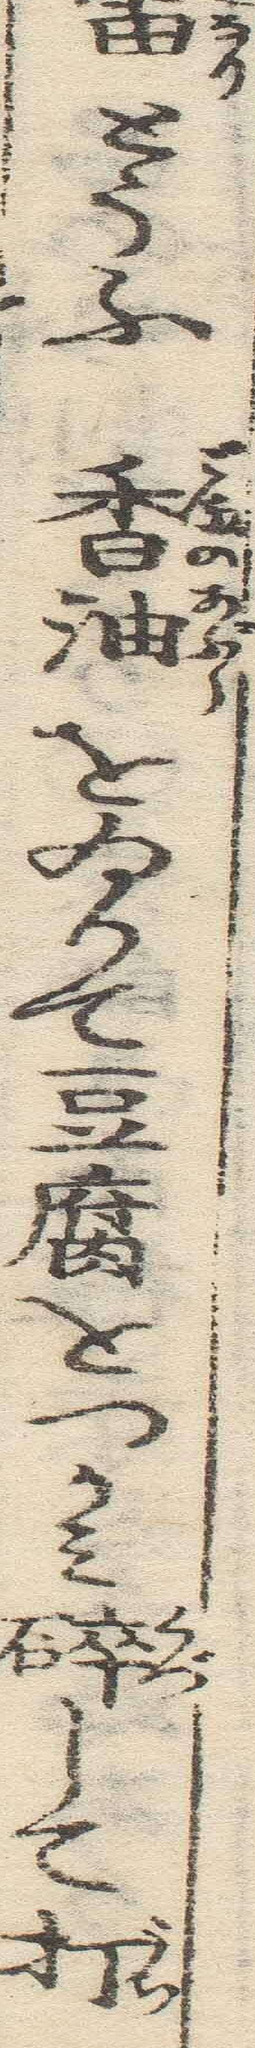[十]雷とうふ香油をゐりて豆腐をつかみ碎して打
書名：豆腐百珍
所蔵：東京学芸大学附属図書館 国文学研究資料館
